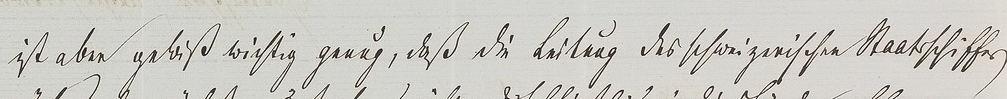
ist aber gewiß wichtig genug, daß die Leitung des schweizerischen Staatsschiffes
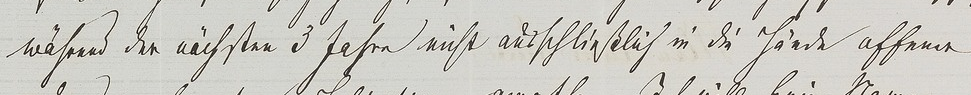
während der nächsten 3 Jahre nicht ausschließlich in die Hände offener
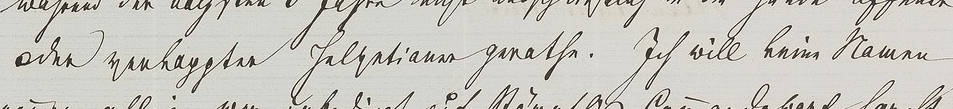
oder verkappter Helvetianer gerathe. Ich will keine Namen
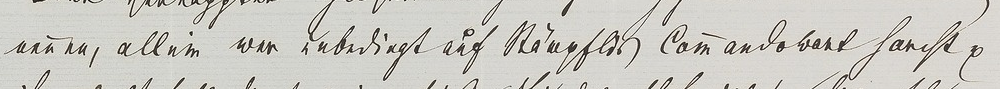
nennen, allein wer unbedingt auf Stämpflis Commandowort horcht &
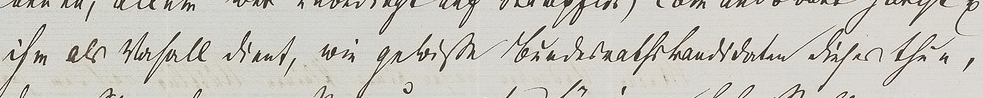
ihm als Vasall dient, wie gewisse Bundesrathskandidaten dieses thun,
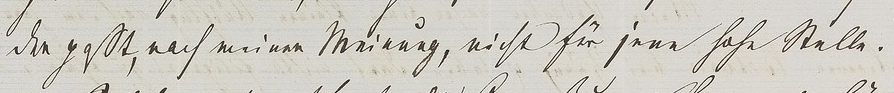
der paßt, nach meiner Meinung, nicht für jene hohe Stelle.
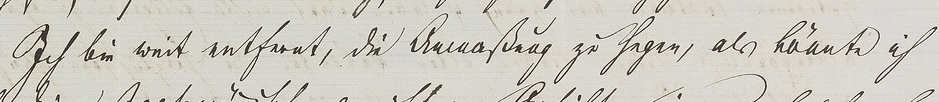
Ich bin weit entfernt, die Anmaßung zu hegen, als könnte ich
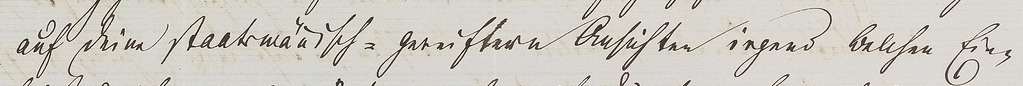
auf Deine staatsmännisch-gereiftern Ansichten irgend welchen Ein-
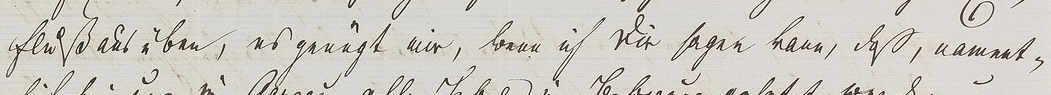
fluß ausüben, es genügt mir, wenn ich Dir sagen kann, daß, nament-
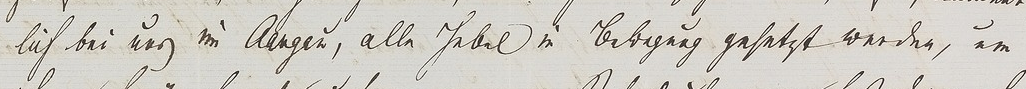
lich bei uns im Aargau, alle Hebel in Bewegung gesetzt werden, um
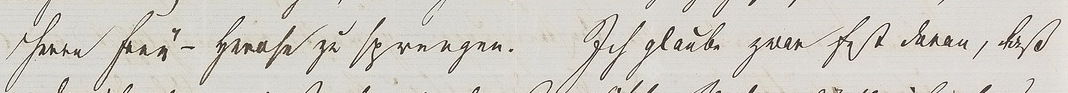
Herrn Frey-Herose zu sprengen. Ich glaube zwar fest daran, daß
